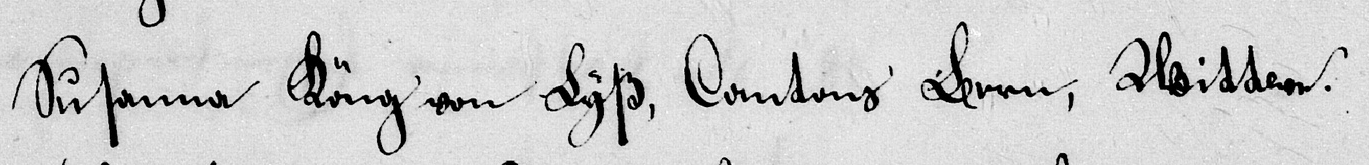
Susanna Küng von Lyß, Cantons Bern, Wittwe.
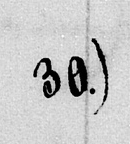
31.)
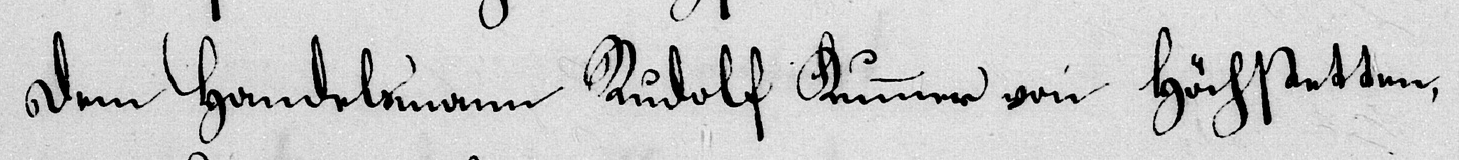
Dem Handelsmann Rudolf Kummer von Höchstetten,
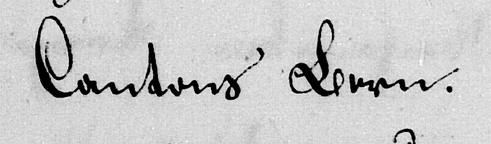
Cantons Bern.
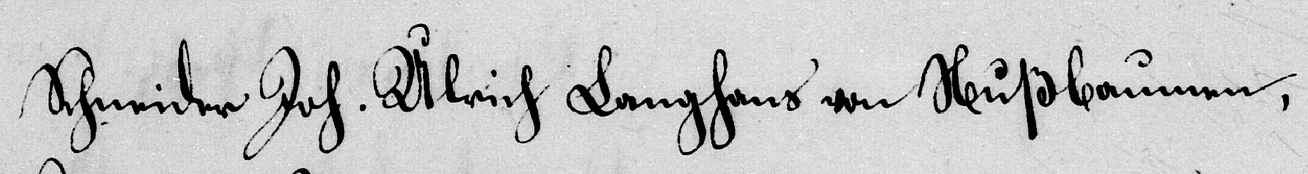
Schneider Joh. Ulrich Langhans von Nußbaumen,
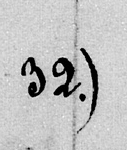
32.)
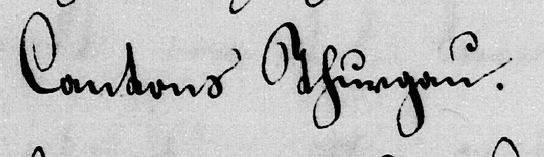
Cantons Thurgau.
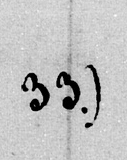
33.)
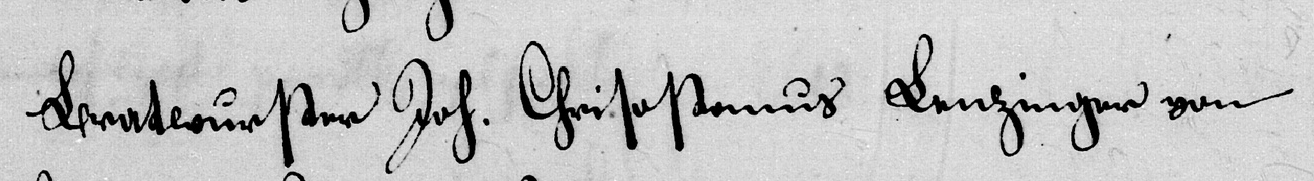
Bratwurster Joh. Chrisostomus Lenzinger von
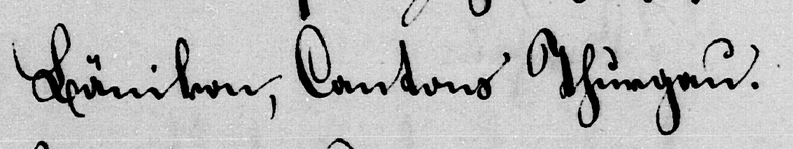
Bänikon, Cantons Thurgau.
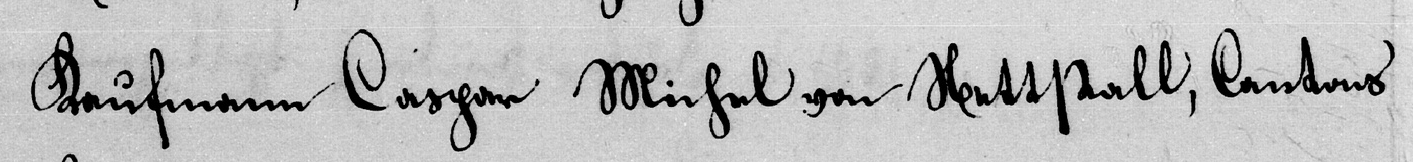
Kaufmann Caspar Michel von Nettstall, Cantons
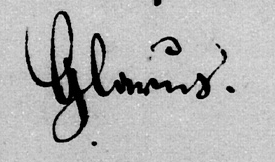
Glarus.
